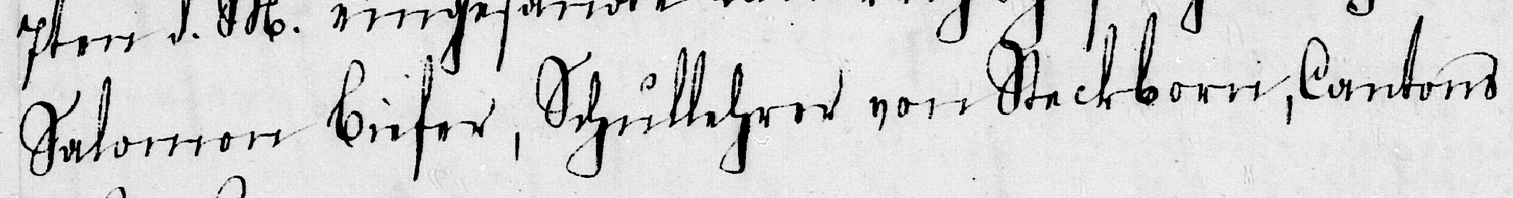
Salomon Biefer, Schullehrer von Steckborn, Cantons
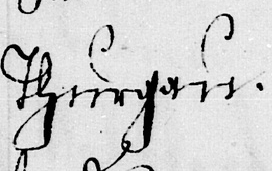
Thurgau.
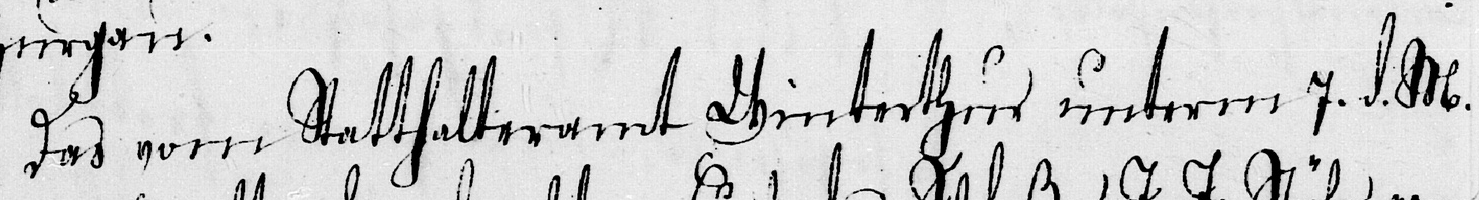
Das vom Statthalteramt Winterthur unterm 7. d. M.
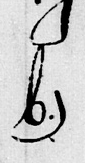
b.)
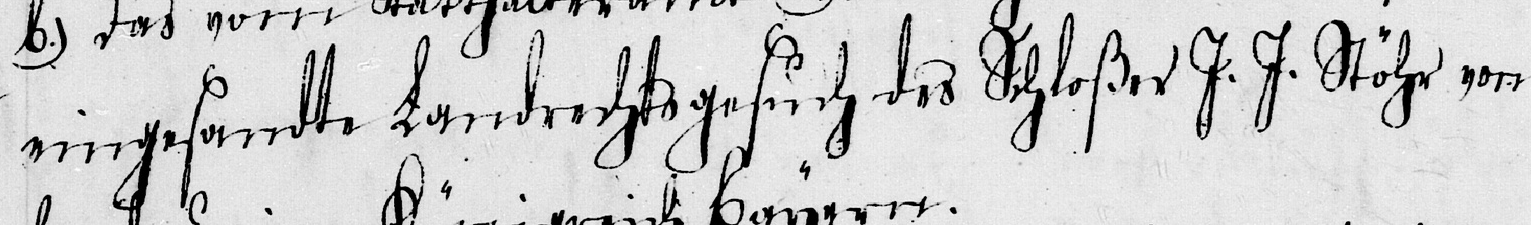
eingesandte Landrechtsgesuch des Schloßer J. J. Stöhr von
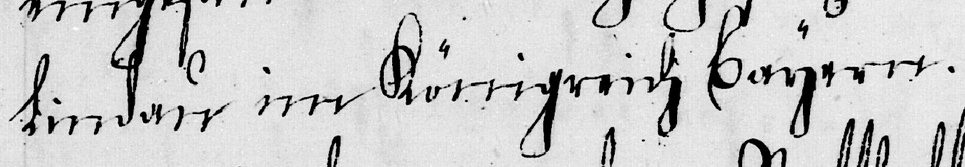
Lindau im Königreich Bayern.
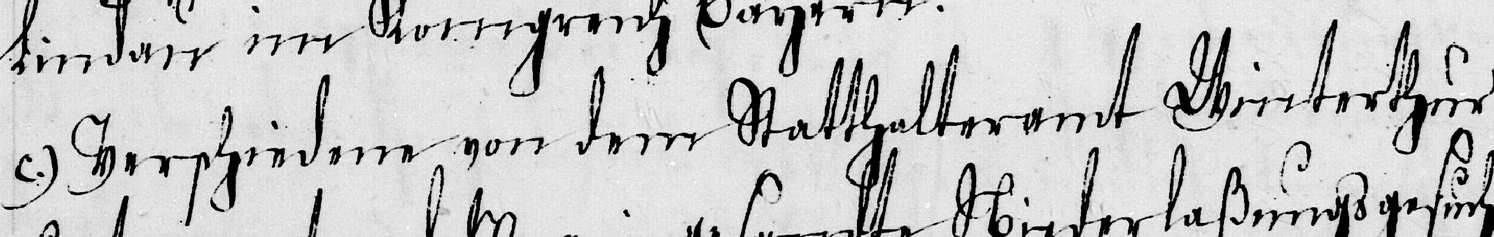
c.) Verschiedene von dem Statthalteramt Winterthur
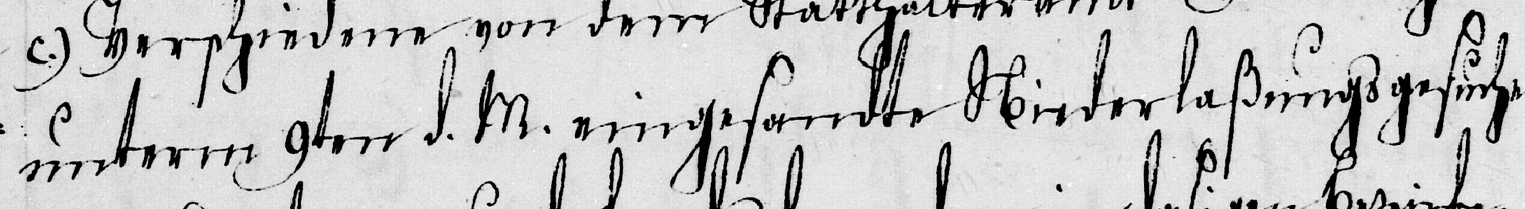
unterm 9ten d. M. eingesandte Niederlaßungsgesuche
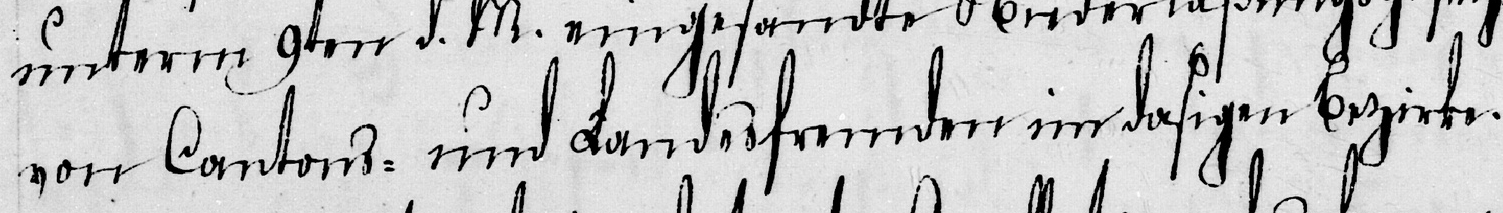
von Cantons- und Landesfremden im dasigen Bezirke.
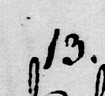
d. M.
